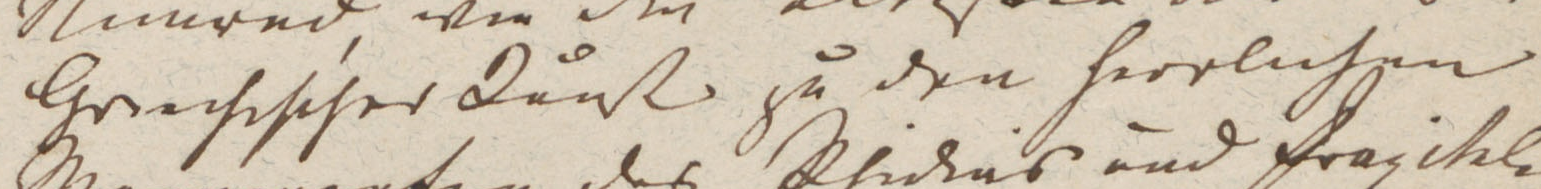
Griechischer Kunst zu den herrlichen
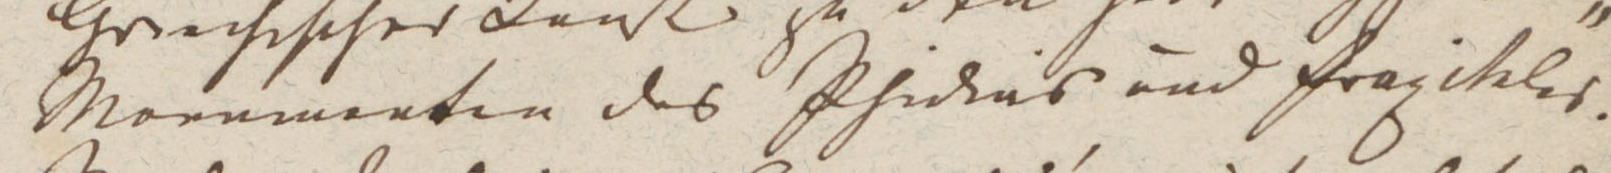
Monumenten des Phidias und Praxiteles."
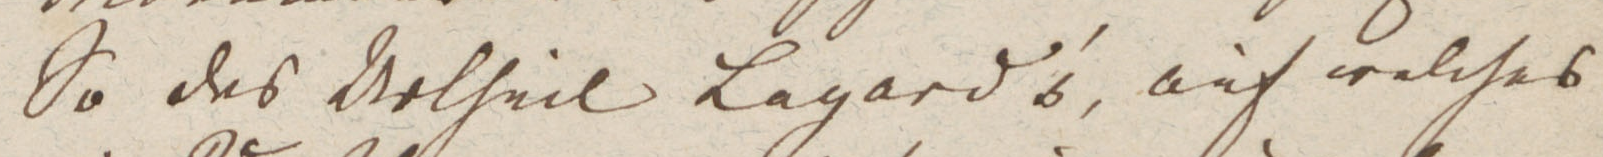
So das Urtheil Layard's, auf welches
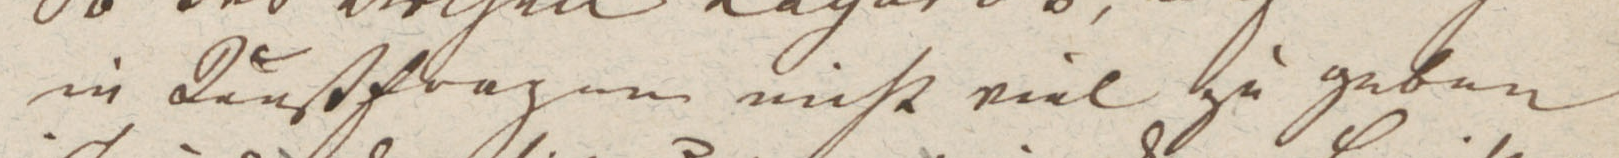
in Kunstfragen nicht viel zu geben
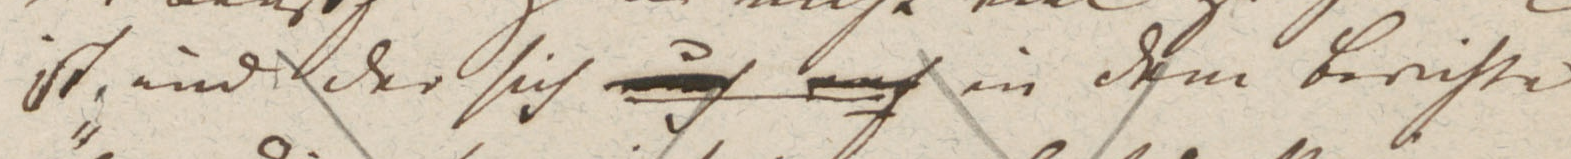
ist, und der sich in dem Berichte
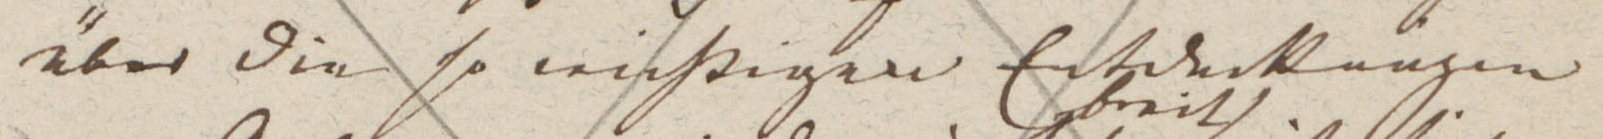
über die so wichtigen Entdeckungen
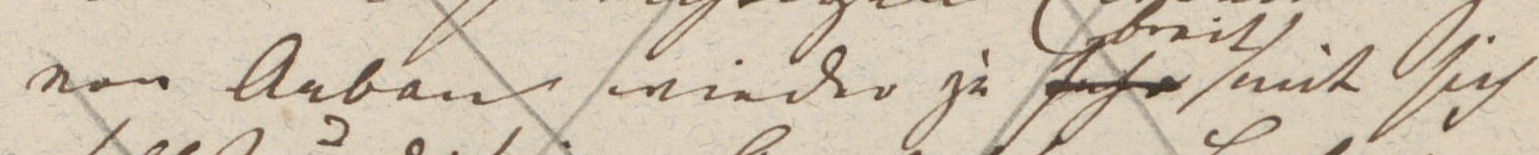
von Auban wieder zu sehr breit mit sich
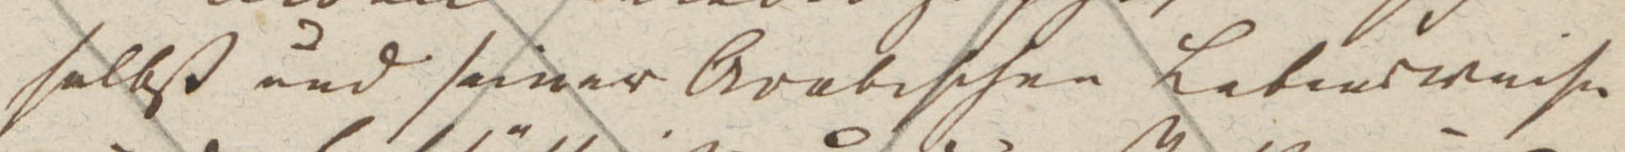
selbst und seiner Arabischen Lebensweise
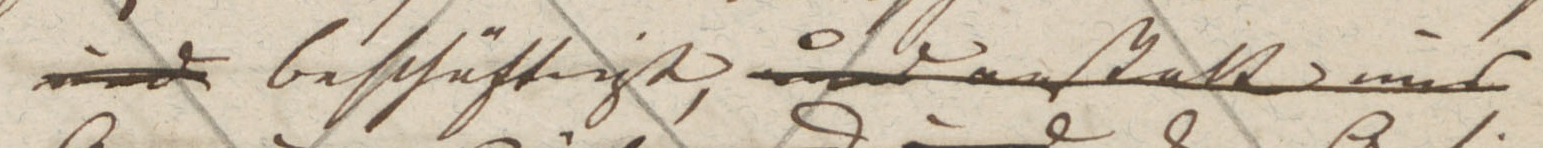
und beschäftigt, und anstatt uns
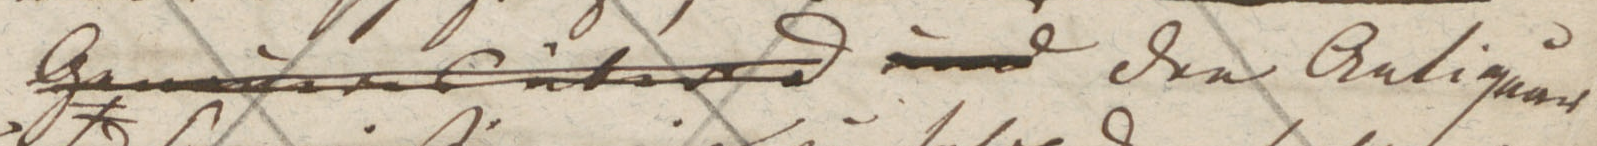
Genaueres über d und den Antiquar
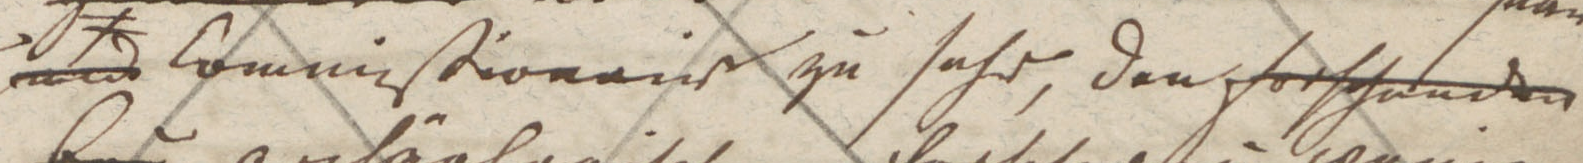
und % Commissionair zu sehr, den forschenden
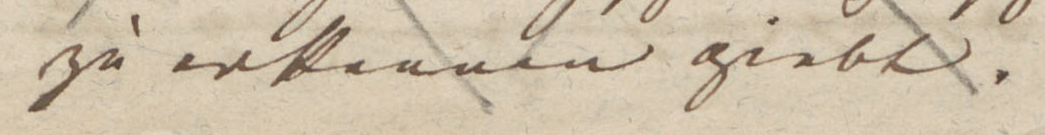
zu erkennen giebt.
